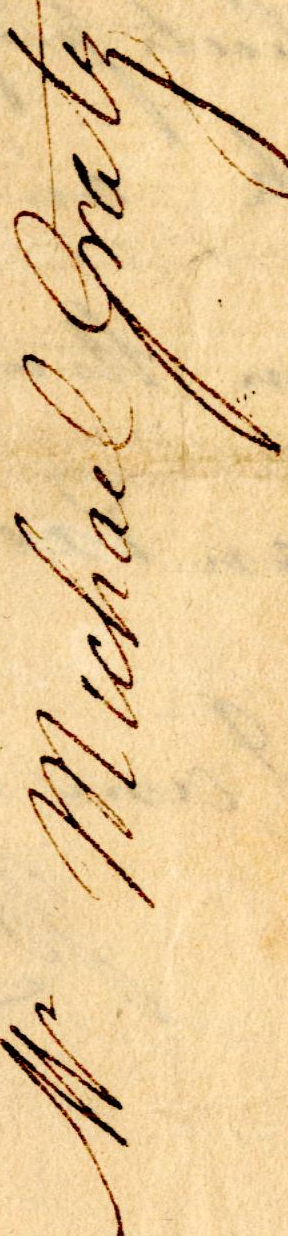M^r Michael Gratz
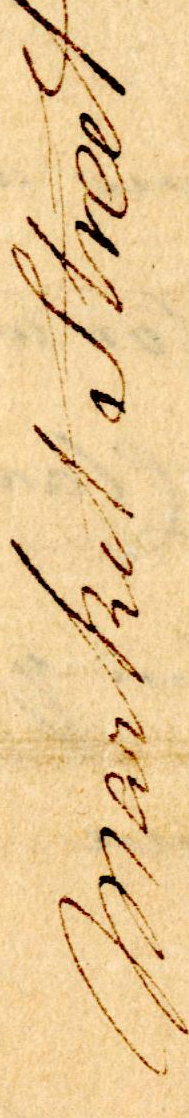Market Street
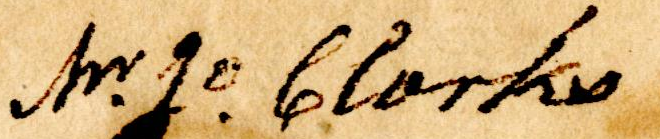M^r. J^o. Clarks
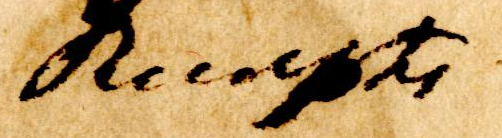Receipts
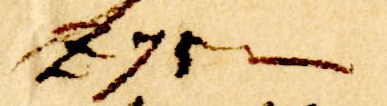£75-
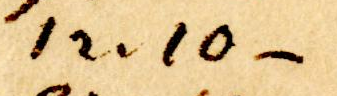12.10-
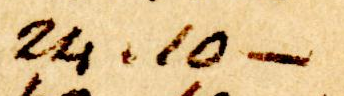24.10-
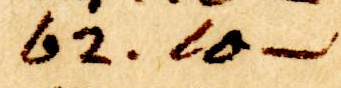62.60-
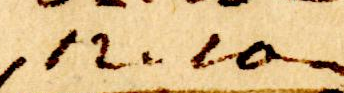12.10-
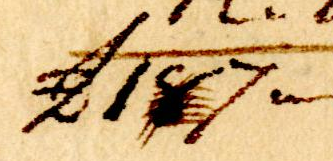£187-
